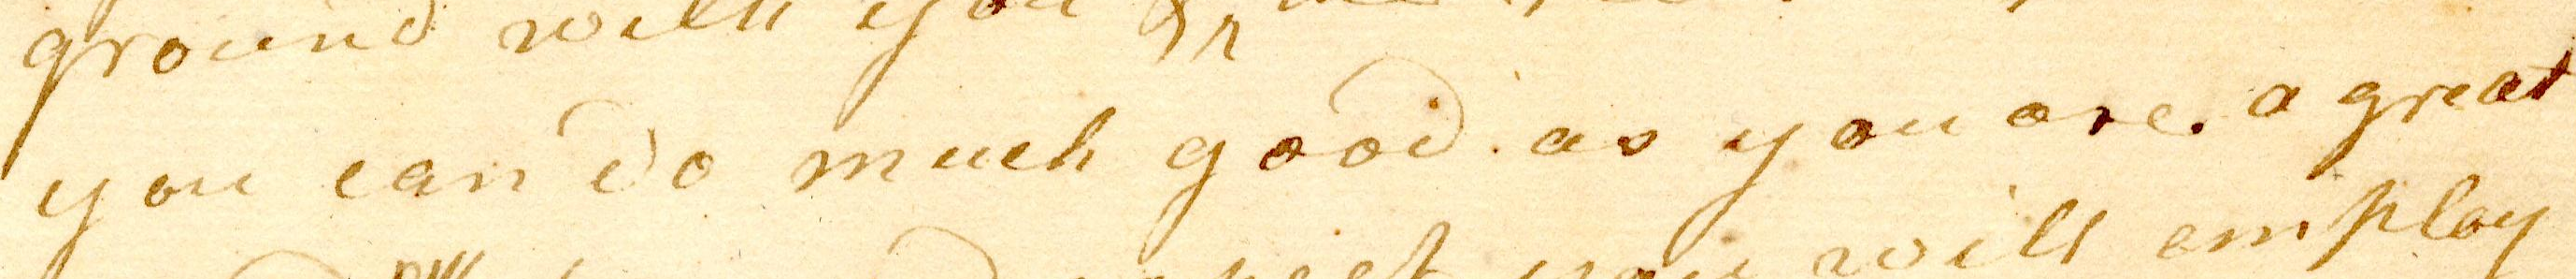you can do much good as you are a great
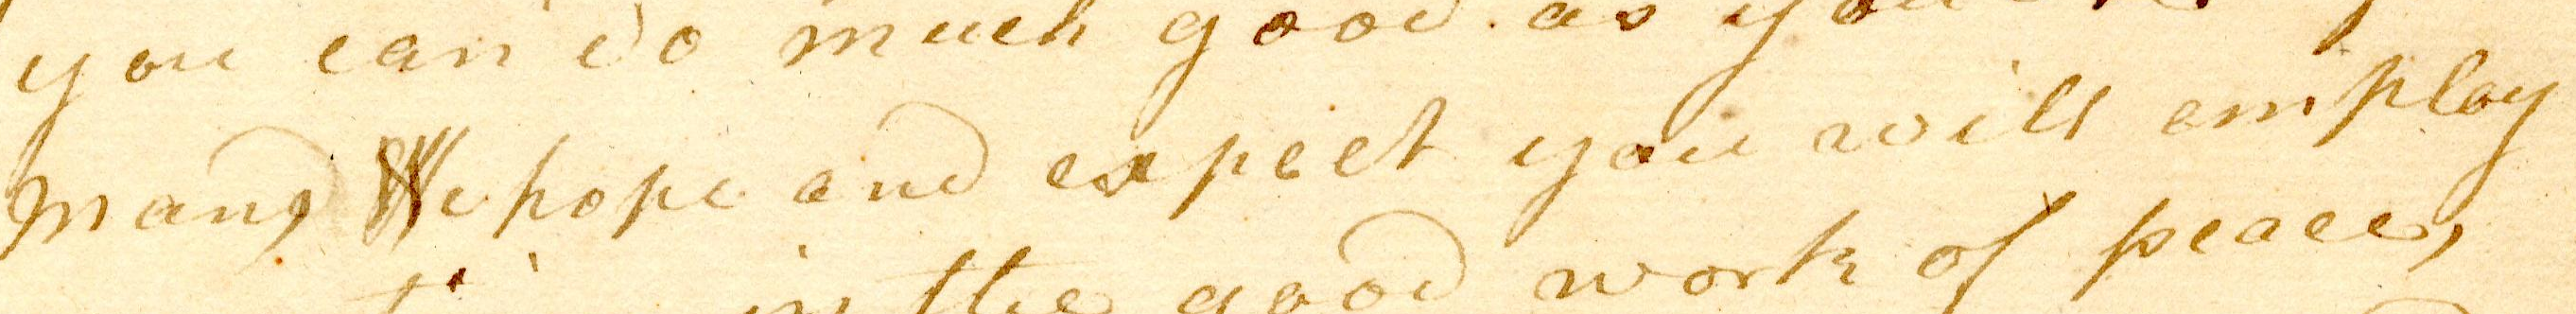man & We hope and expect you will employ
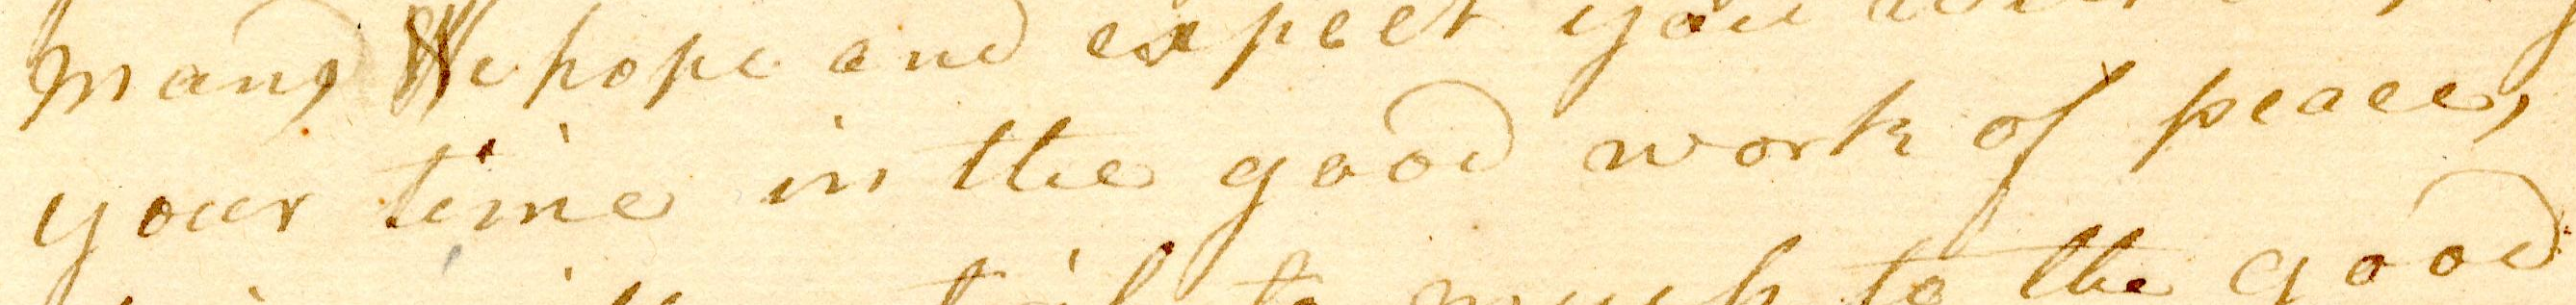your time in the good work of peace,
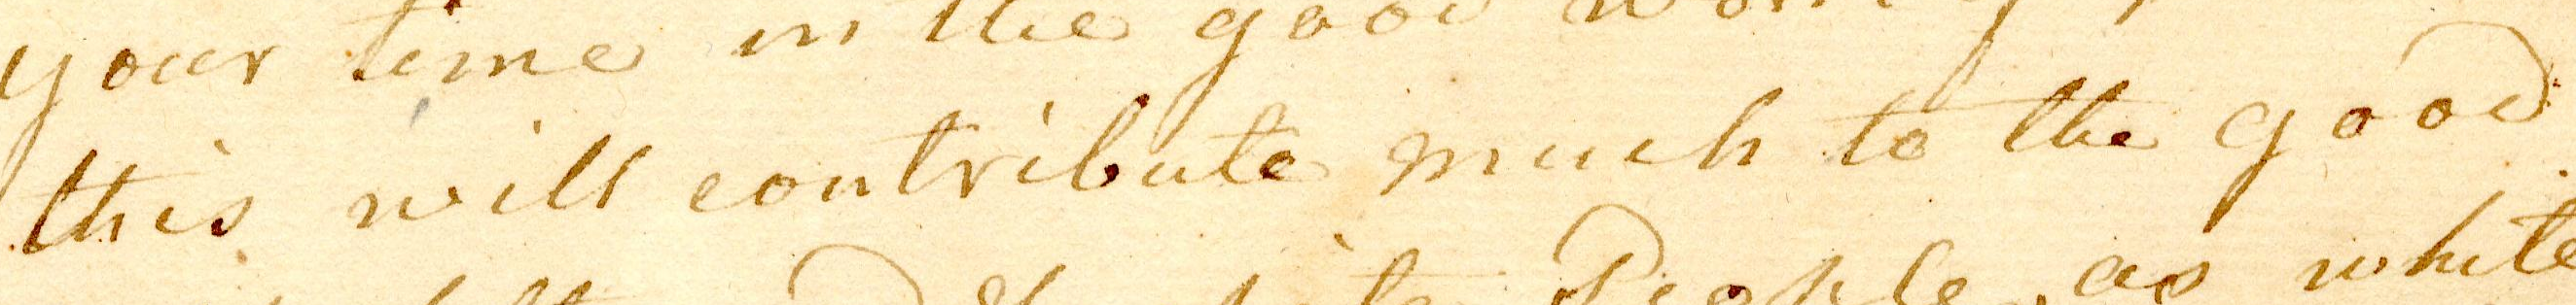this will contribute much to the good
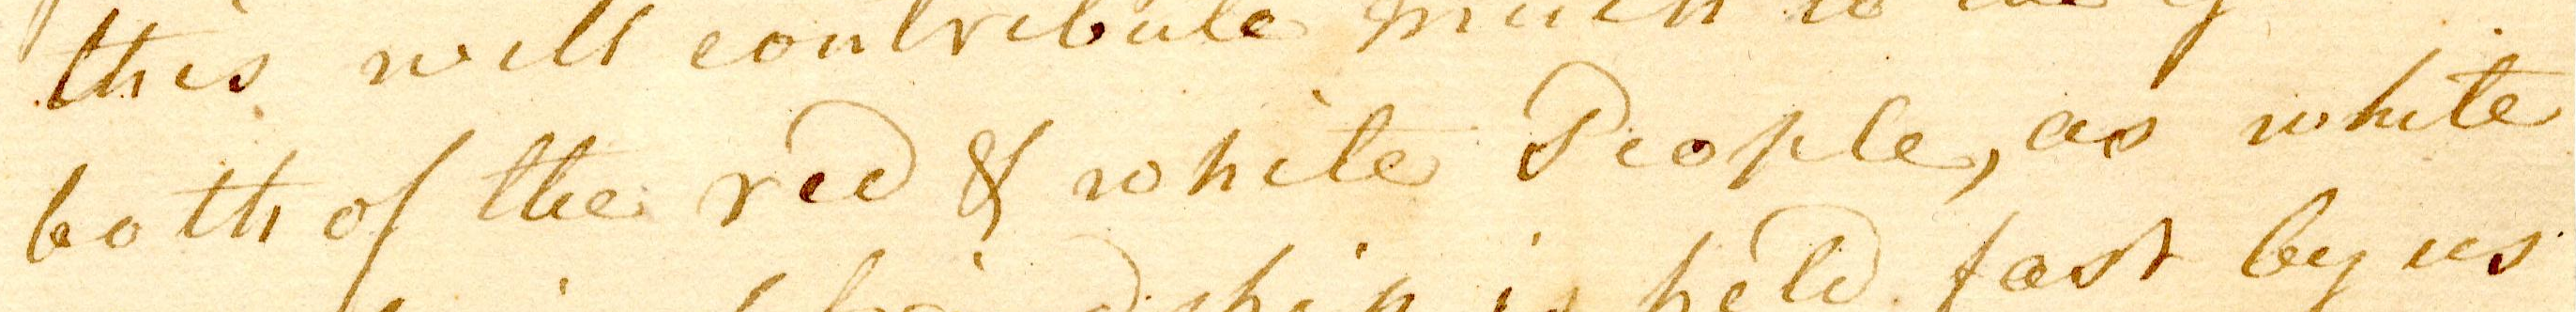both of the red & white People, as white
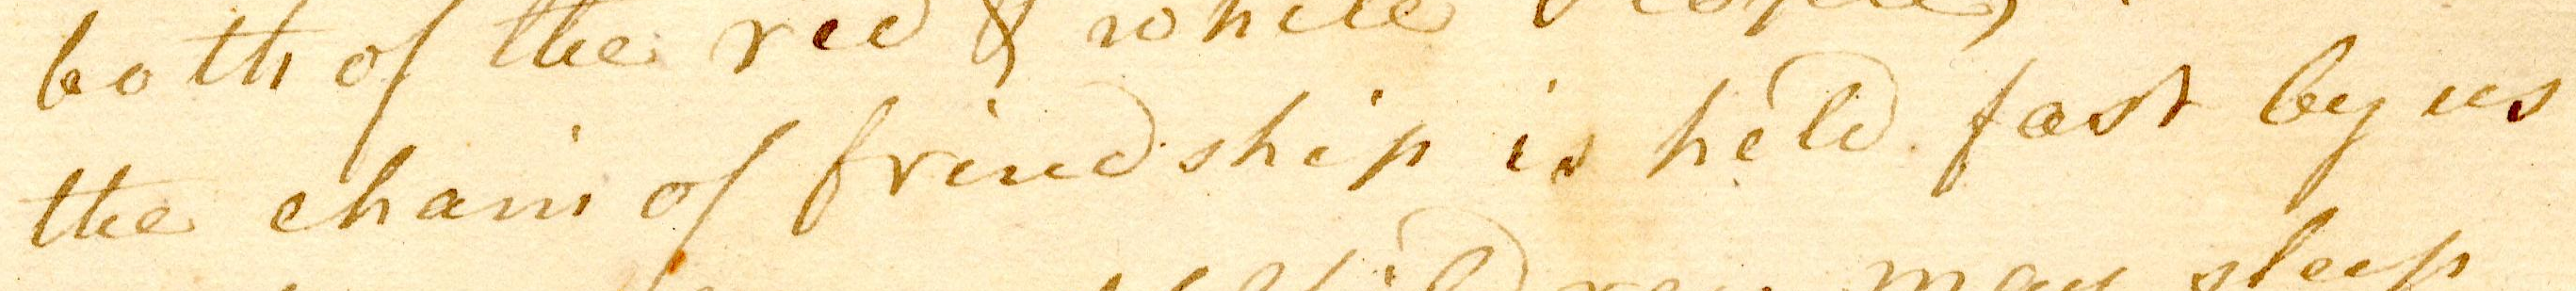the chain of friendship is held fast by us
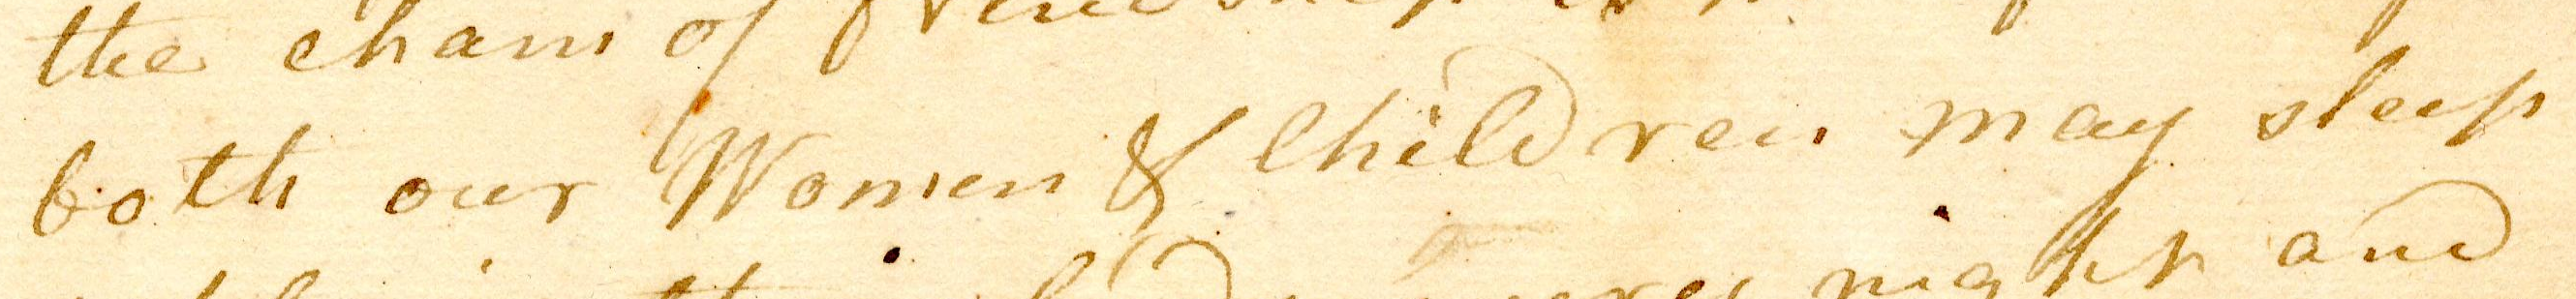both our Women & Children may sleep
